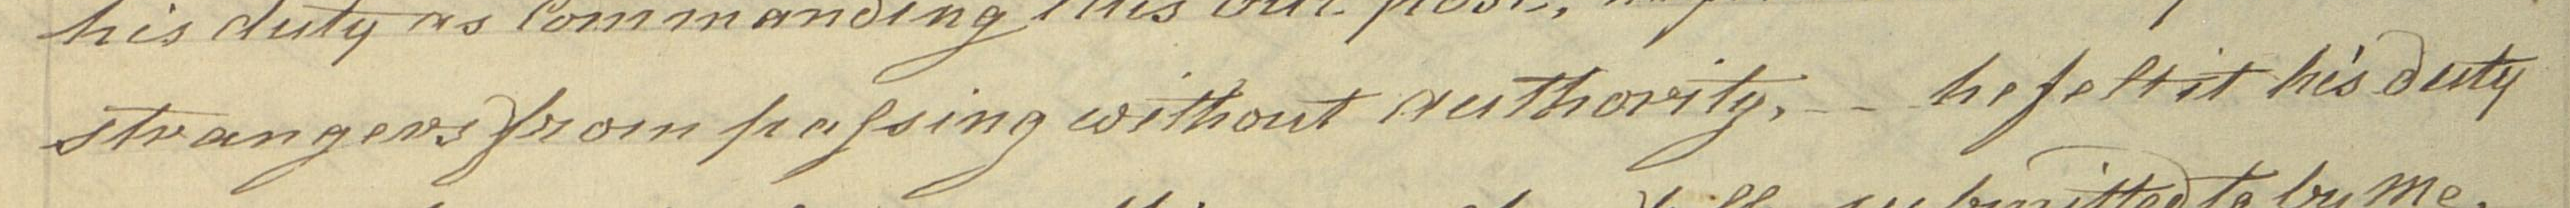strangers from passing without authority, be felt it his duty
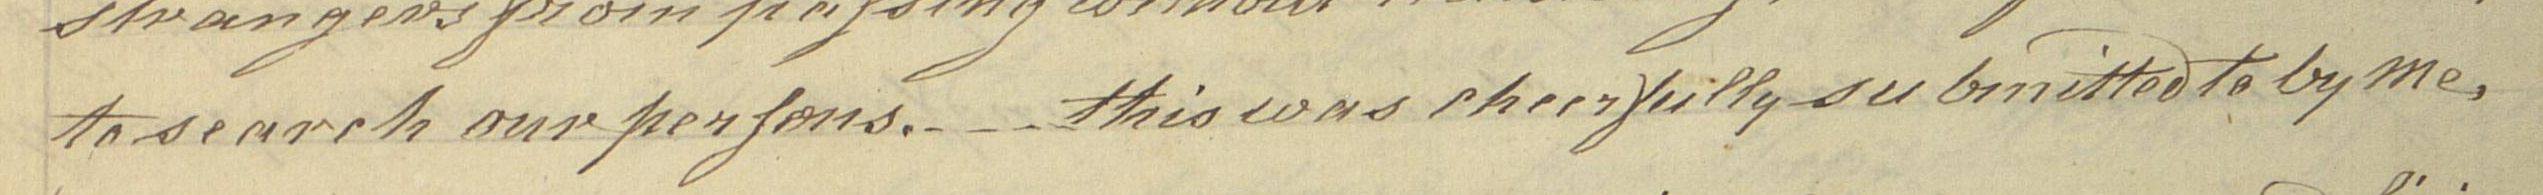to search our persons. this was cheerfully submitted to by me,
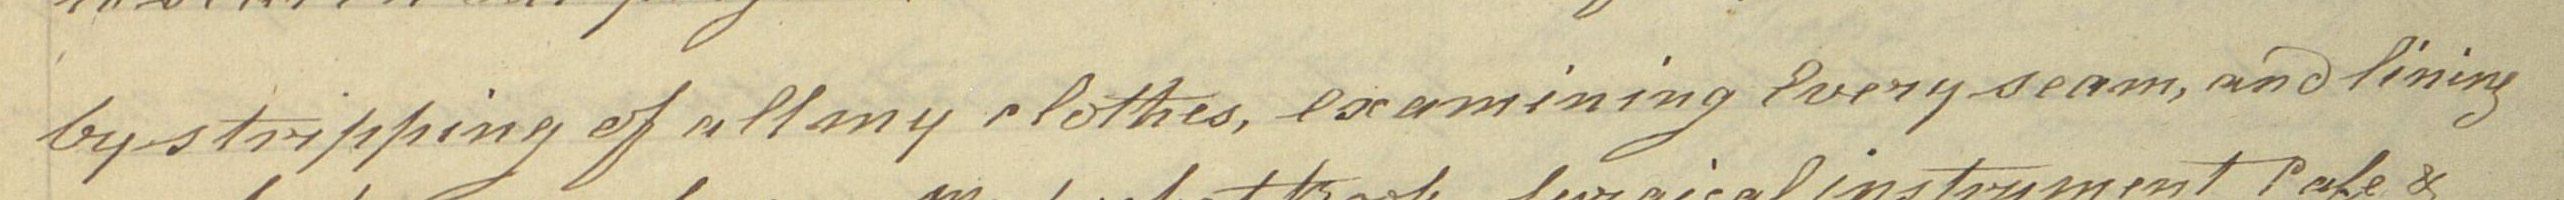by stopping of all my clothes, examining every seam, and lining
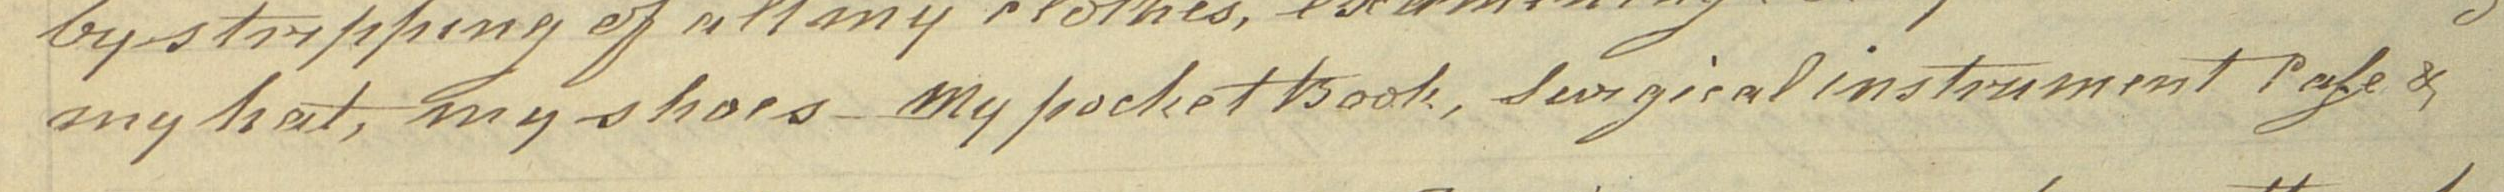my hat, my shoes, my pocket book, surgical instrument case &
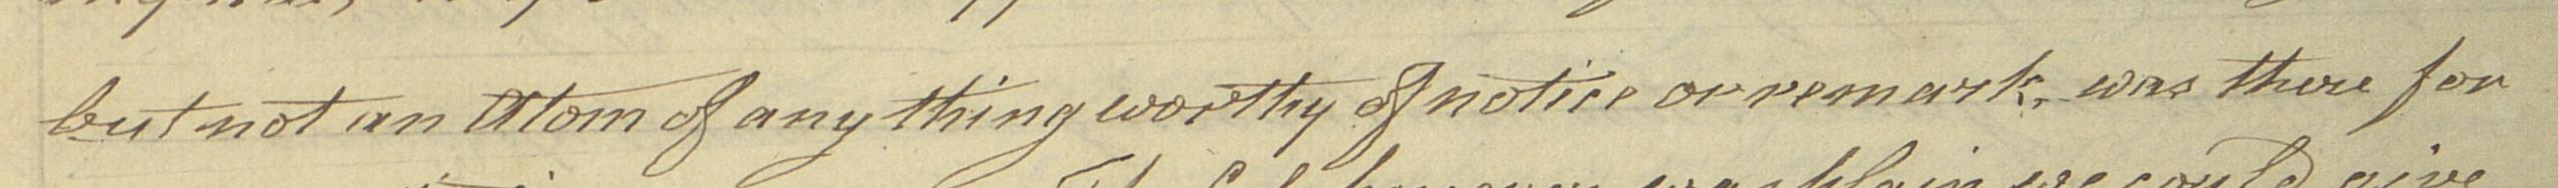but not an atom of any thing worthy of notice or remark was there for
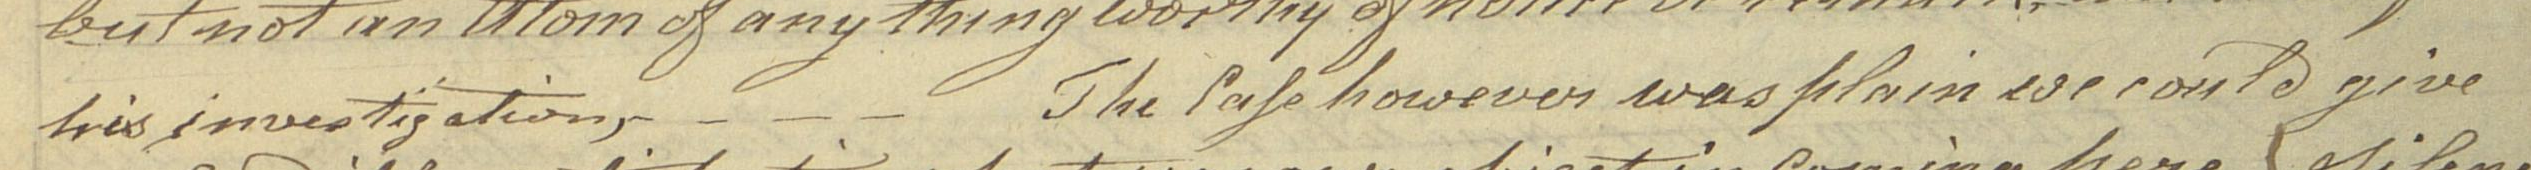his investigation, The case however was plain we could give
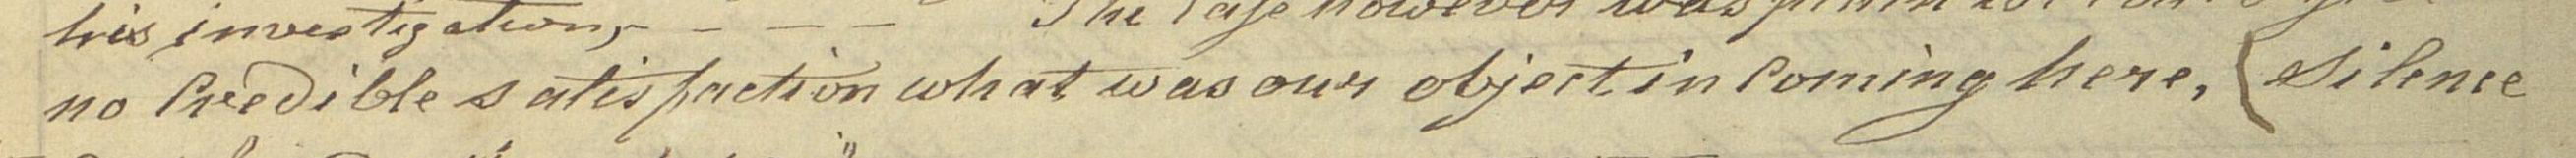no Credible satisfaction what was our object in coming here, (Silence
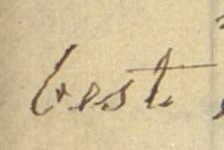best
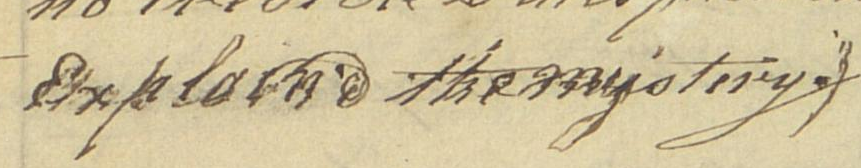Explain'd the mystery.)
